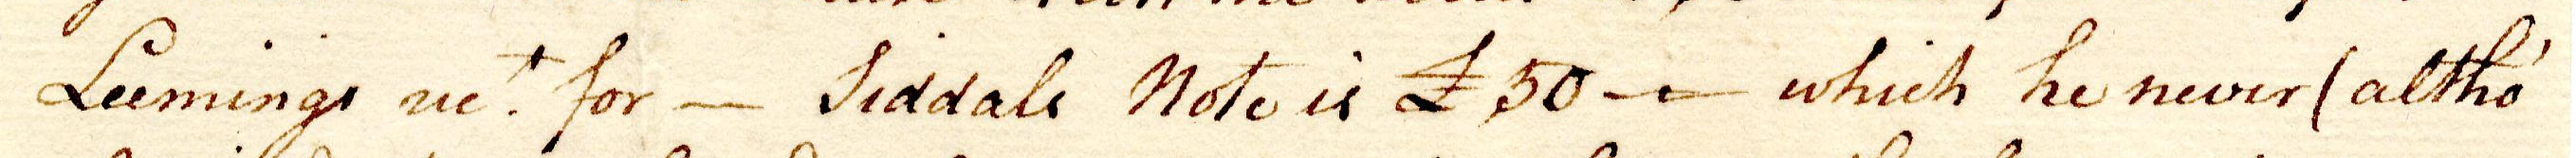Leemings rec^t. for Siddals Note is £50, which he never (altho'
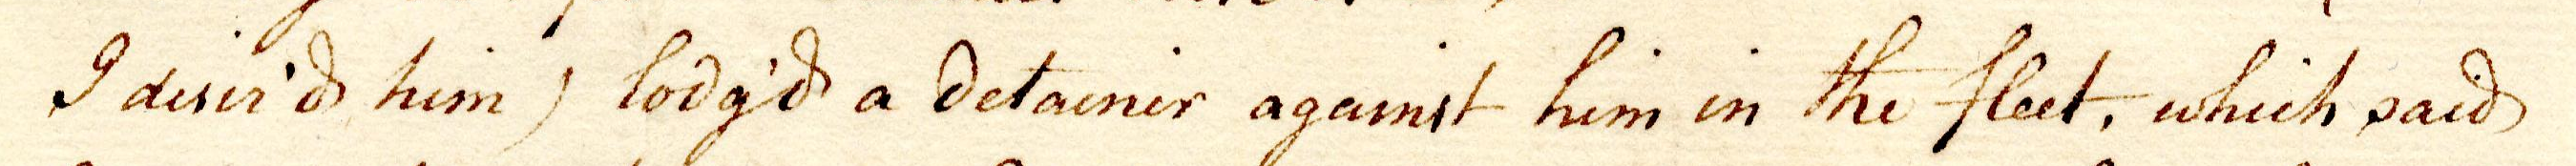I desir'd him) lodg'd a detainer against him in the fleet, which said
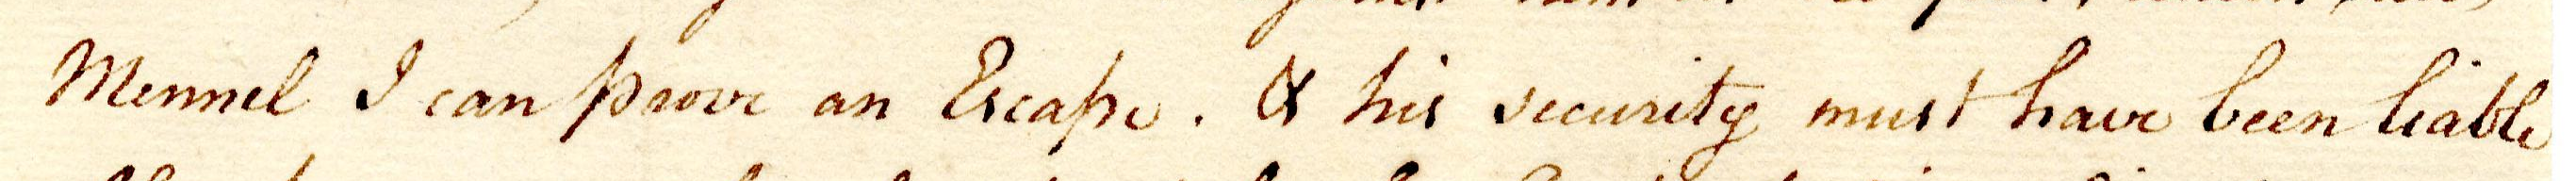Mennel I can prove an Escape. & his security must have been liable
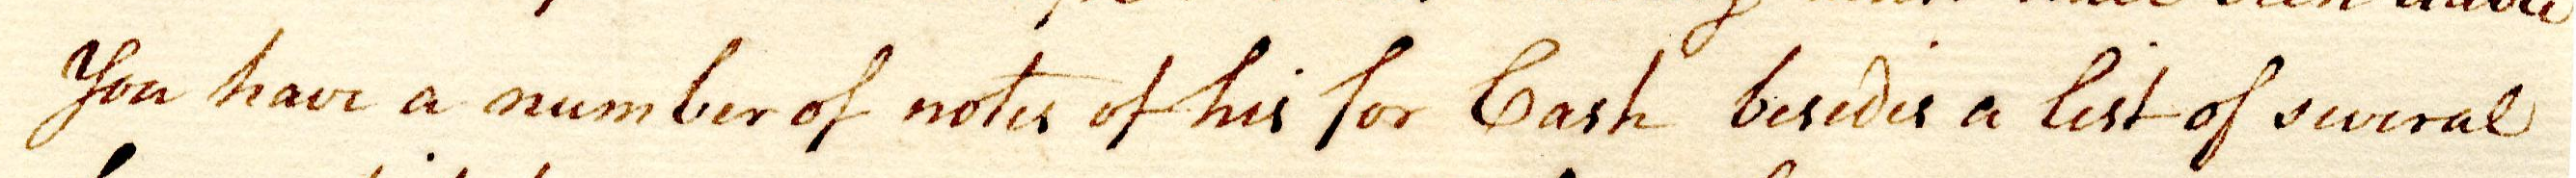You have a number of notes of his for Cash besides a lest of several
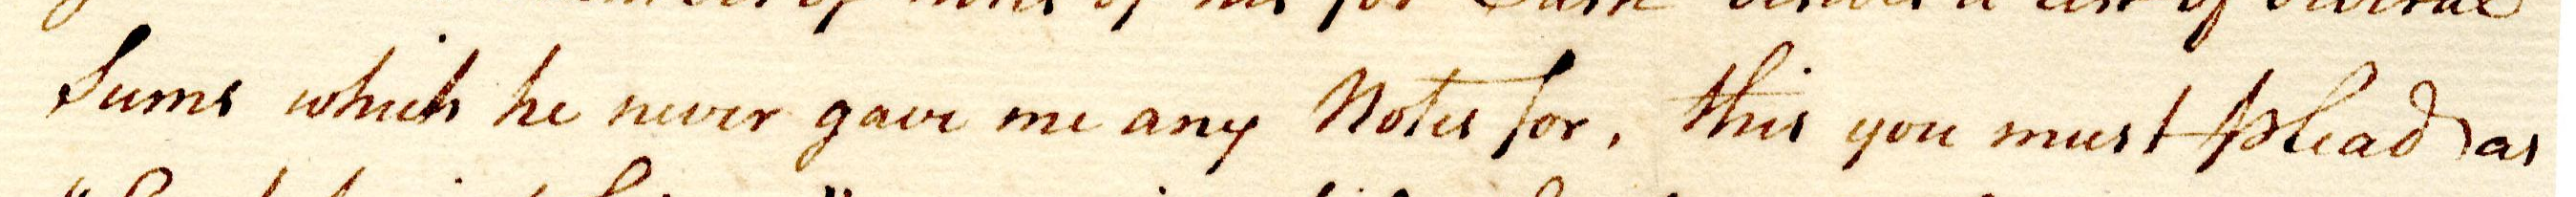Sums which he never gave me any Notes for, this you must plead as
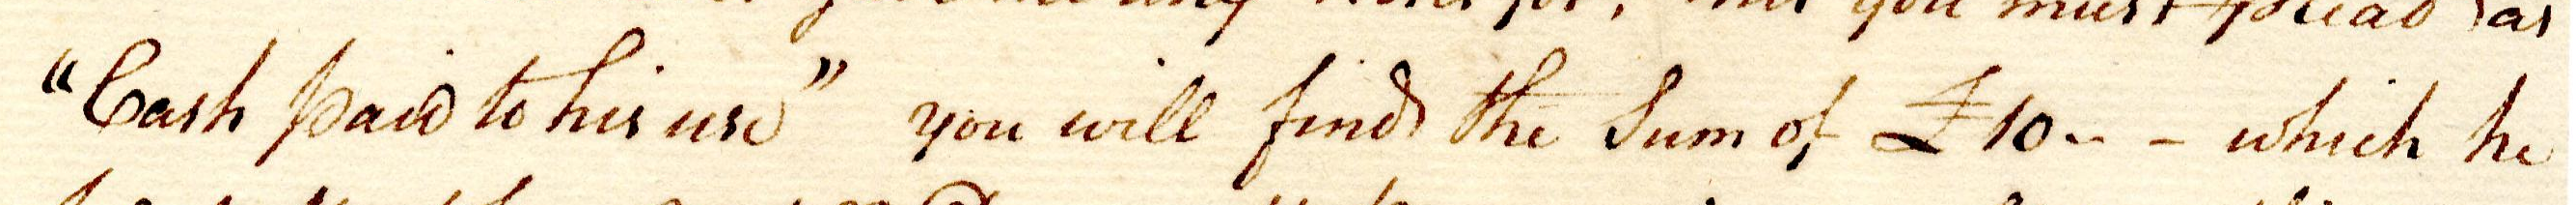"Cash paid to his use" you will find the Sum of £10, which he
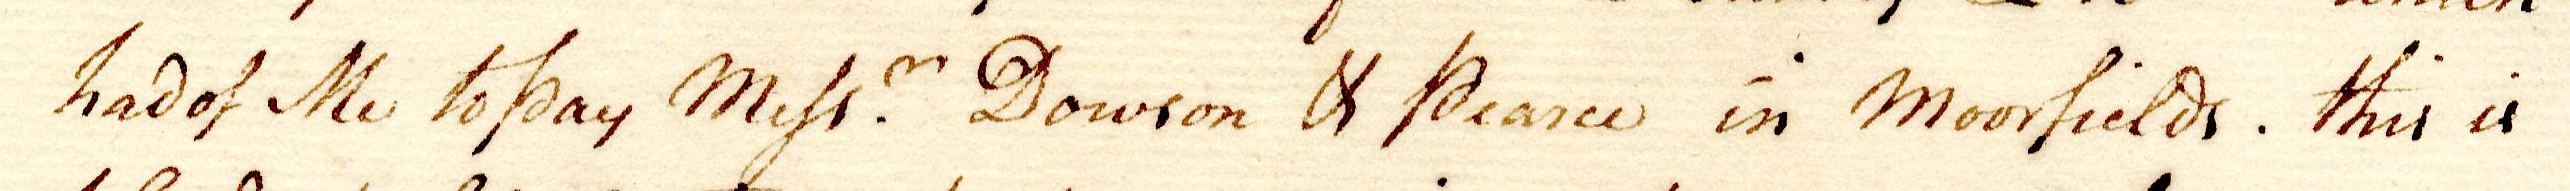had of Me to pay Mess^rs. Dowson & Pearce in Moorfields. this is
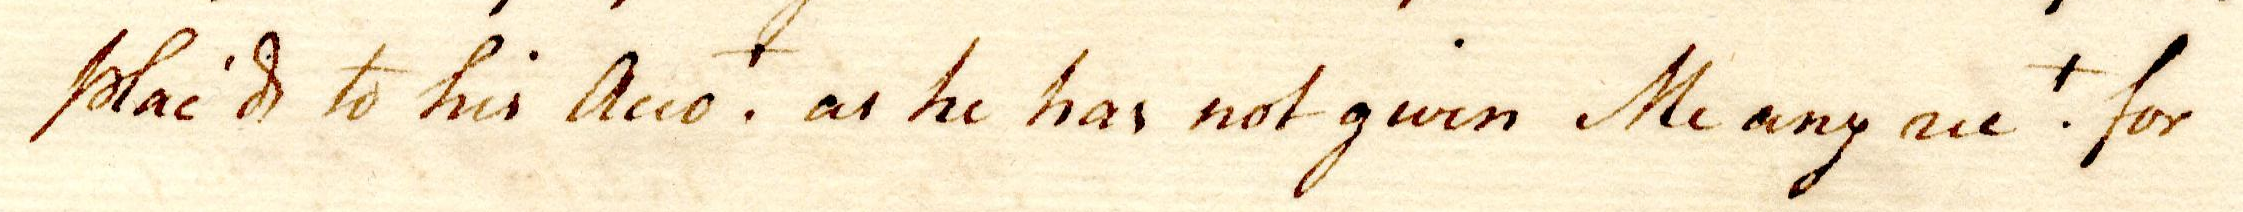plac'd to his Acco^t. as he has not given Me any rec^t. for
